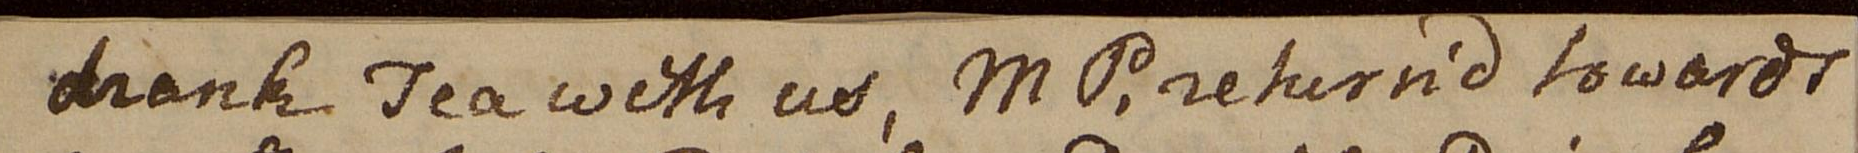drank Tea with us, M P. return'd towards
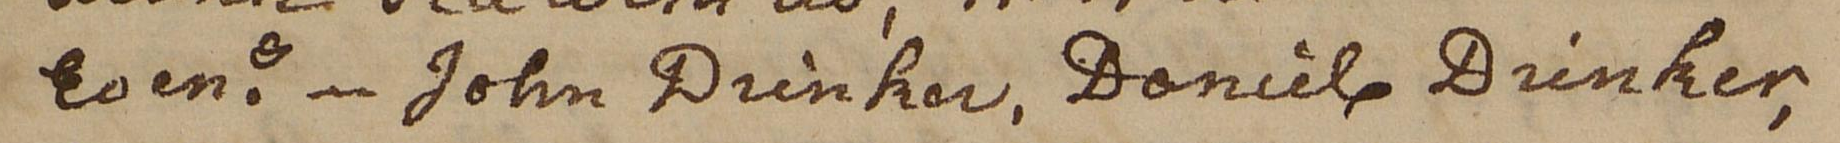Even^g.- John Drinker, Daniel Drinker,
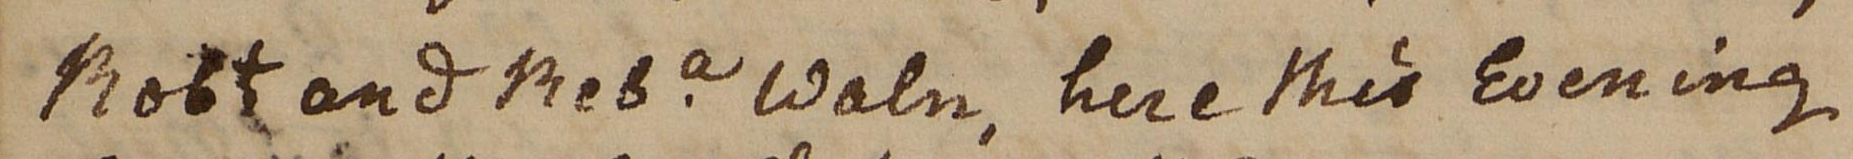Robt and Reb^a. Waln, here this Evening
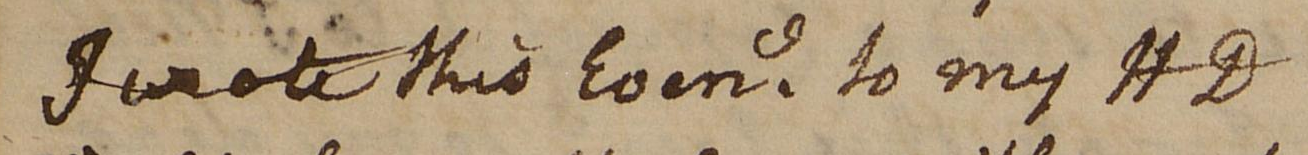I wrote this Even^g. to my H D
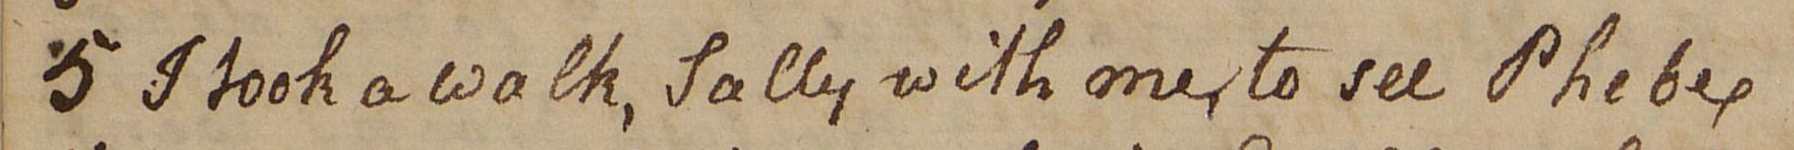5 I took a walk, Sally with me to see Phebe
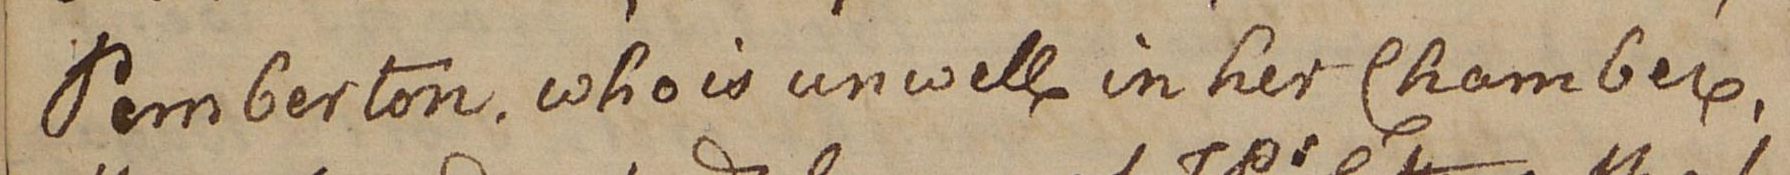Pemberton, who is unwell in her Chamber,
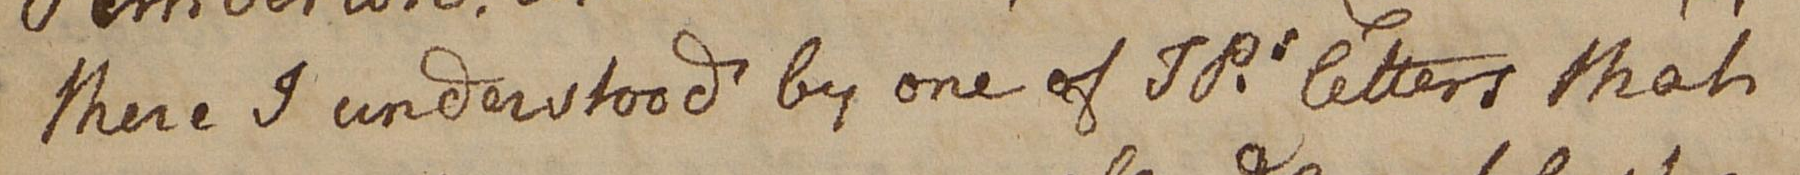there I understood by one of SP^s. letters that
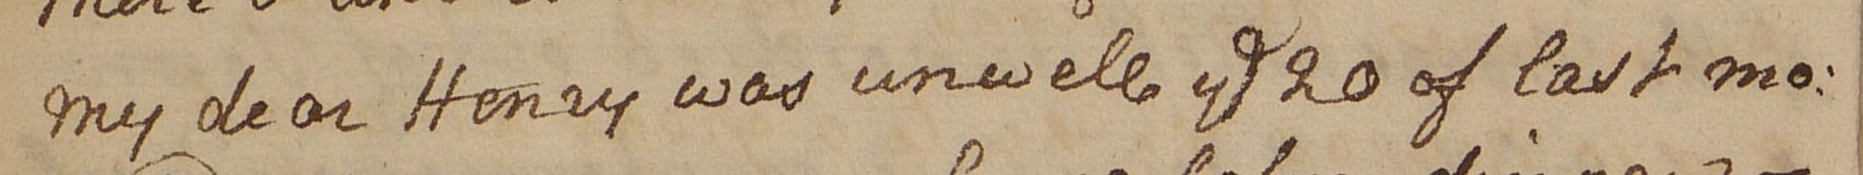my dear Henry was unwell y^e 20 of last mo:
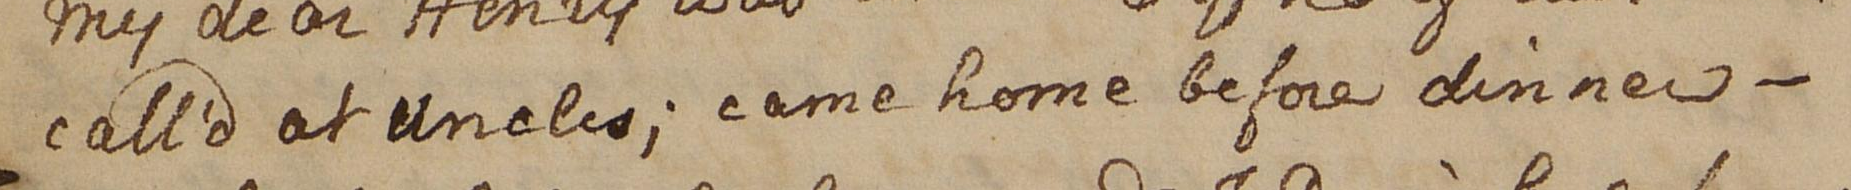call'd at uncles; came home before dinner-
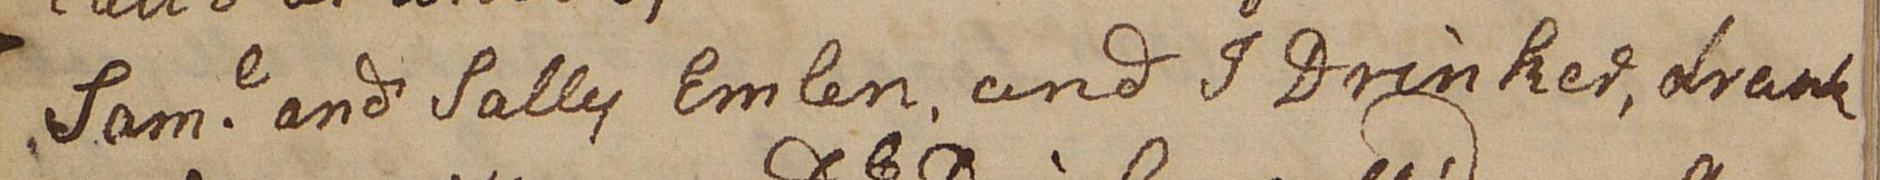Sam^l. and Sally Emlen, and I Drinker, drank
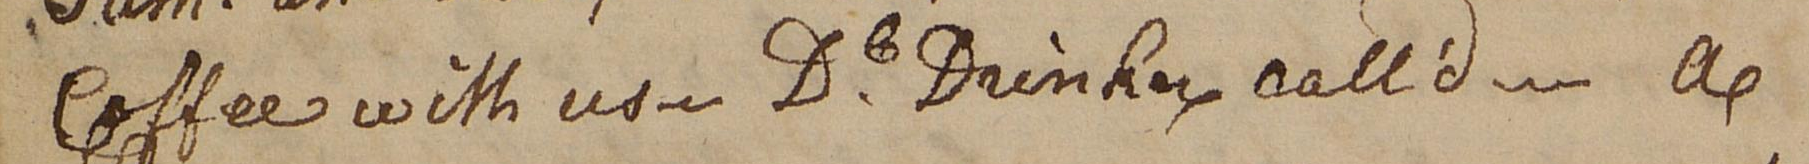Coffee with us- D^l. Drinker call'd- A
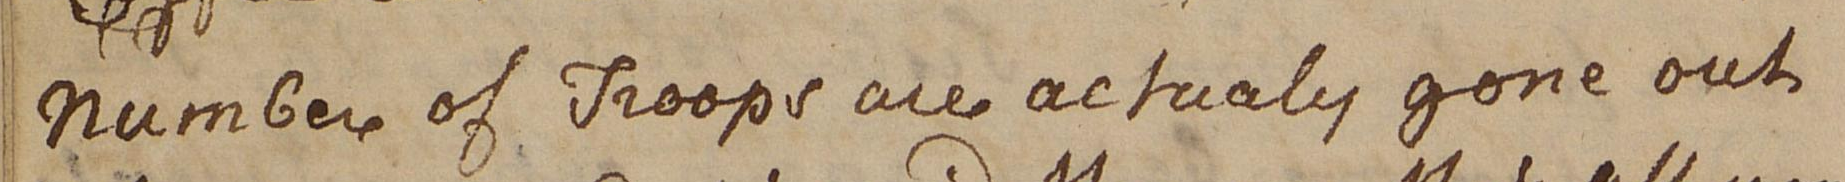Number of Troops are actualy gone out
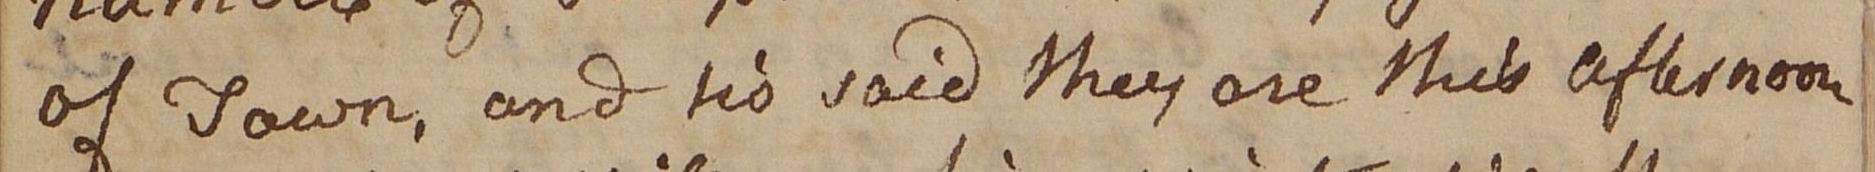of Town, and tis said they are this afternoon
